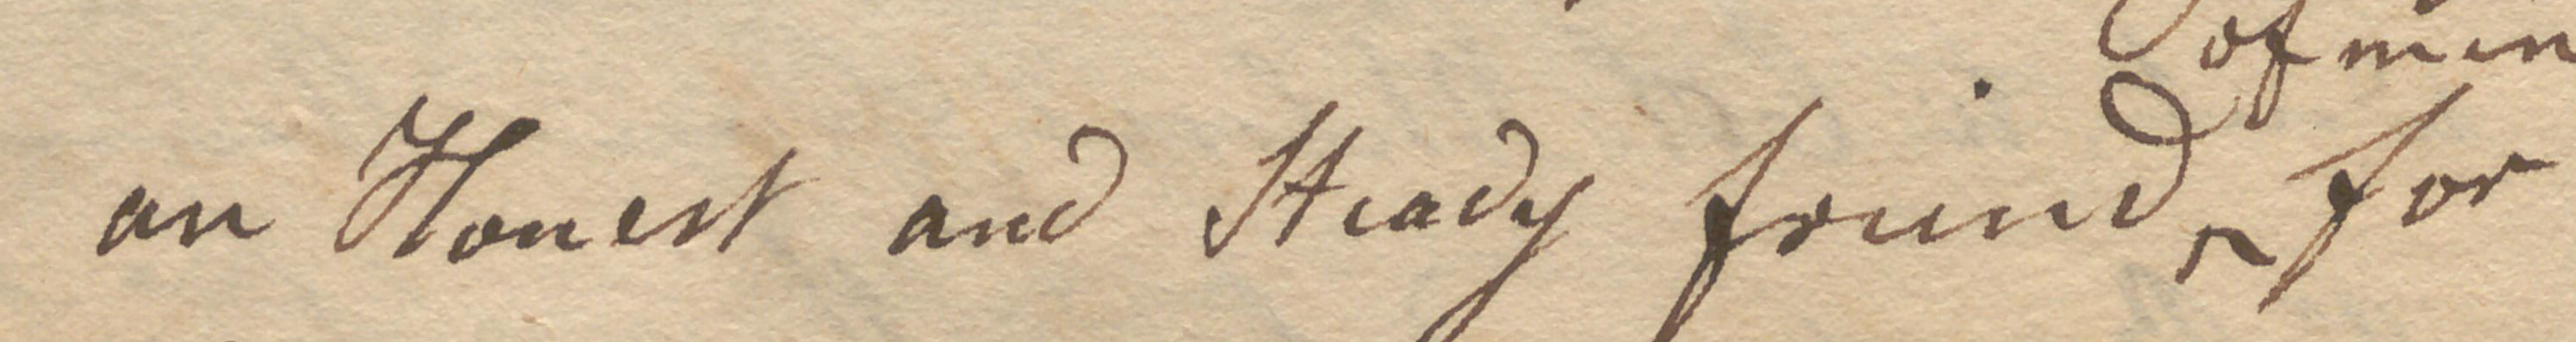ane Honest and Steady friend ^ for
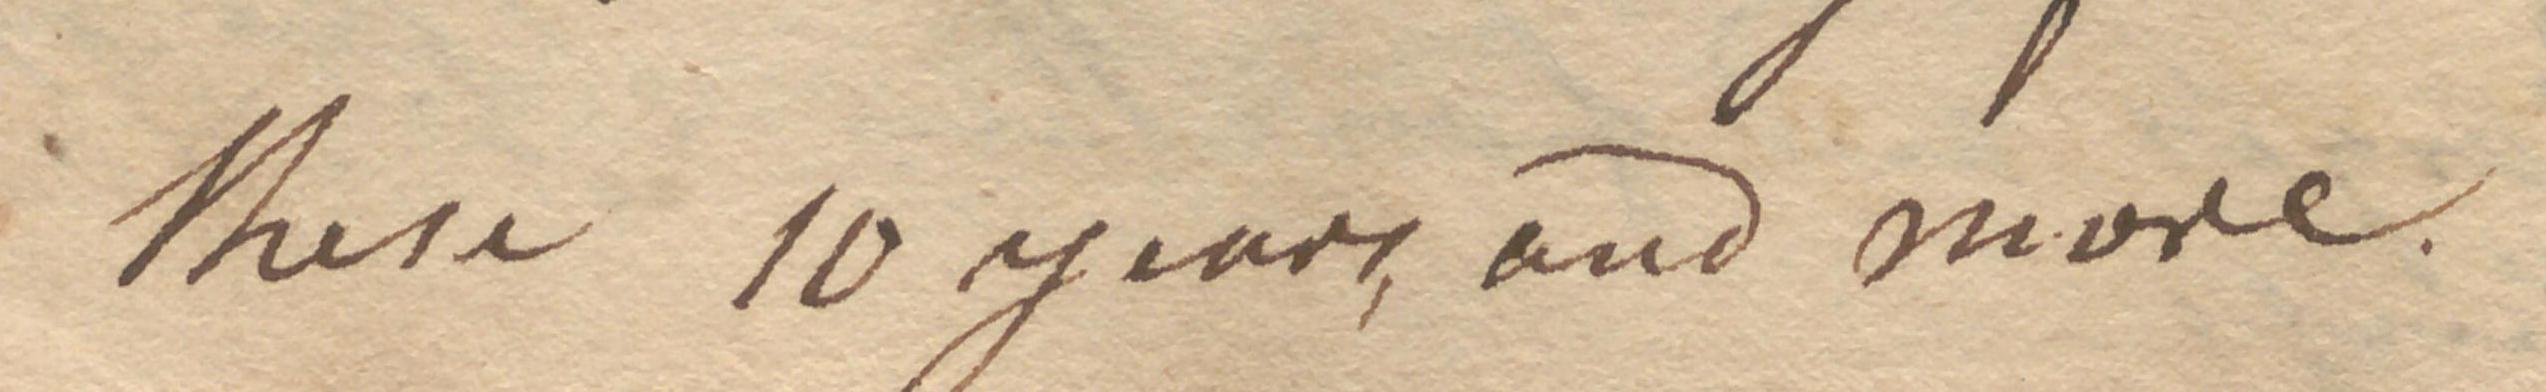these 10 years, and more.
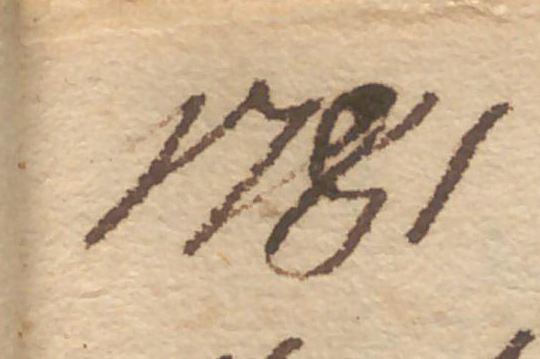1781
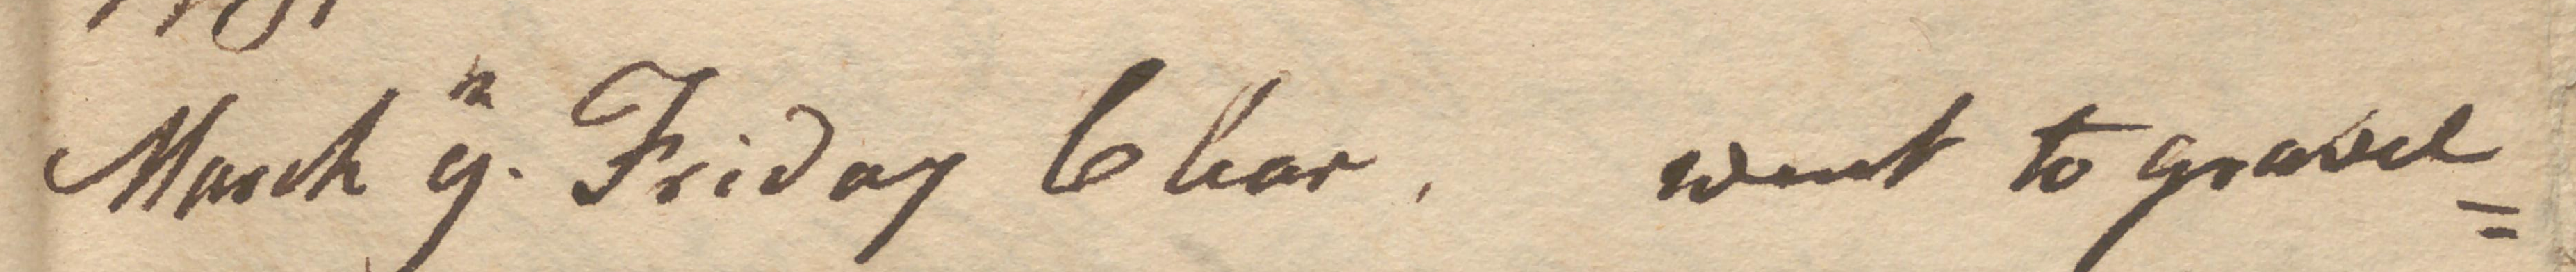March 9^th. Friday Clear, went to gravel
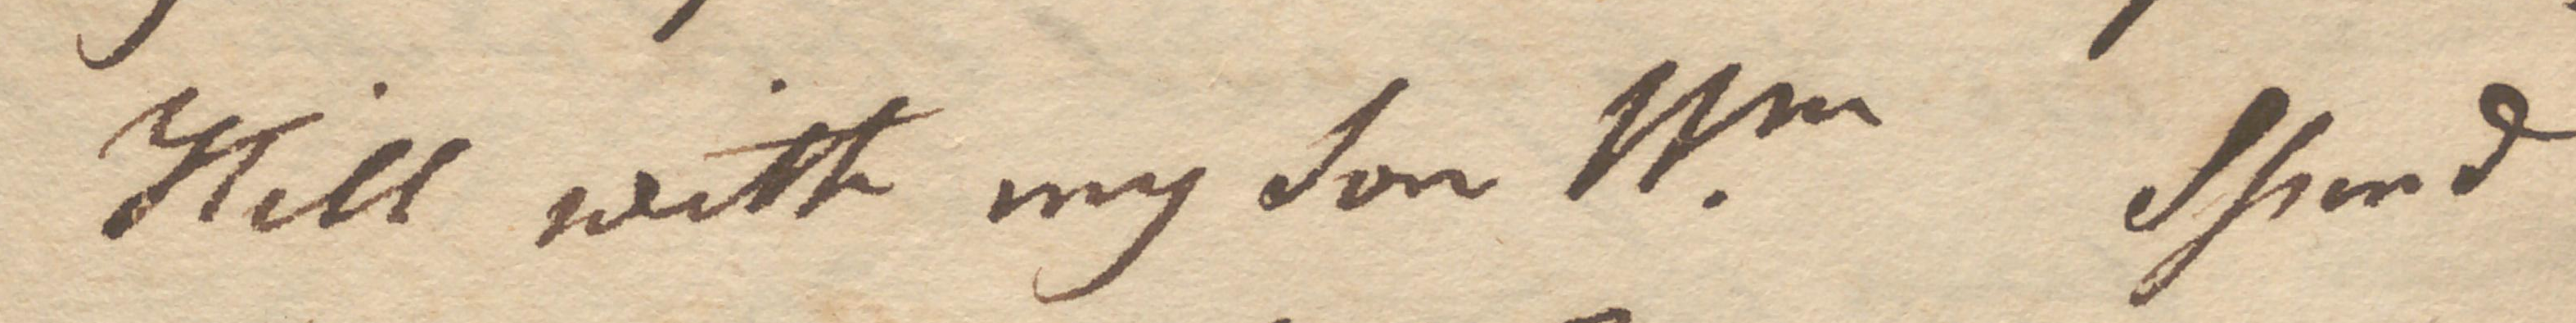Hill with my Son W^m. Spend
